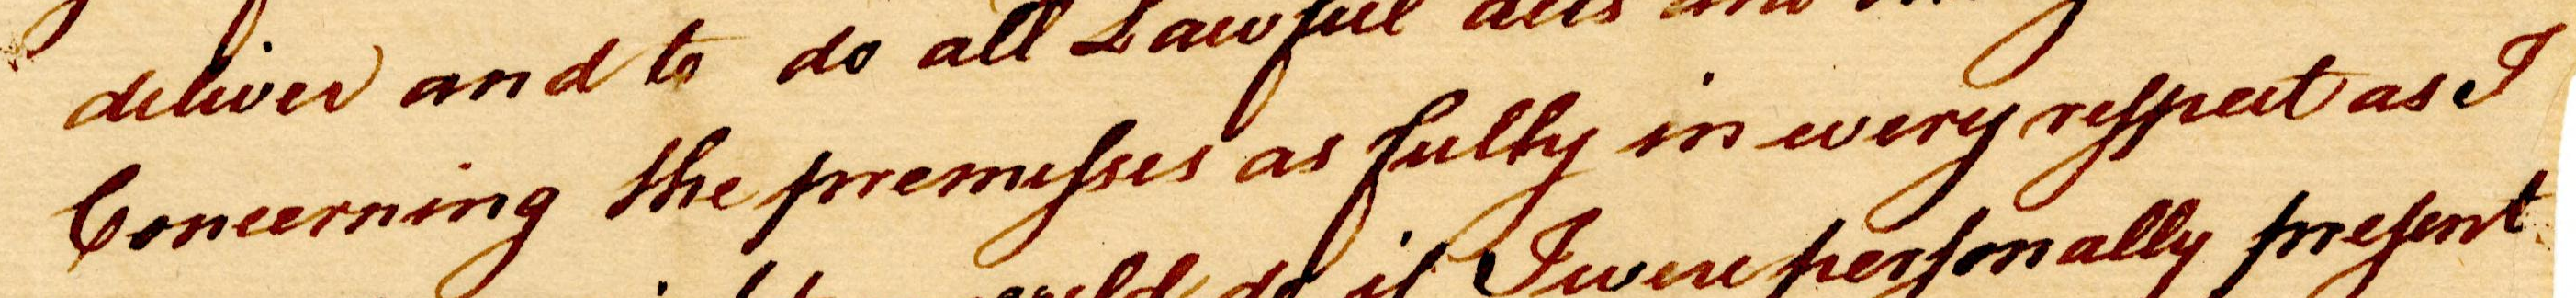Concerning the promisses as fully in every respect as I
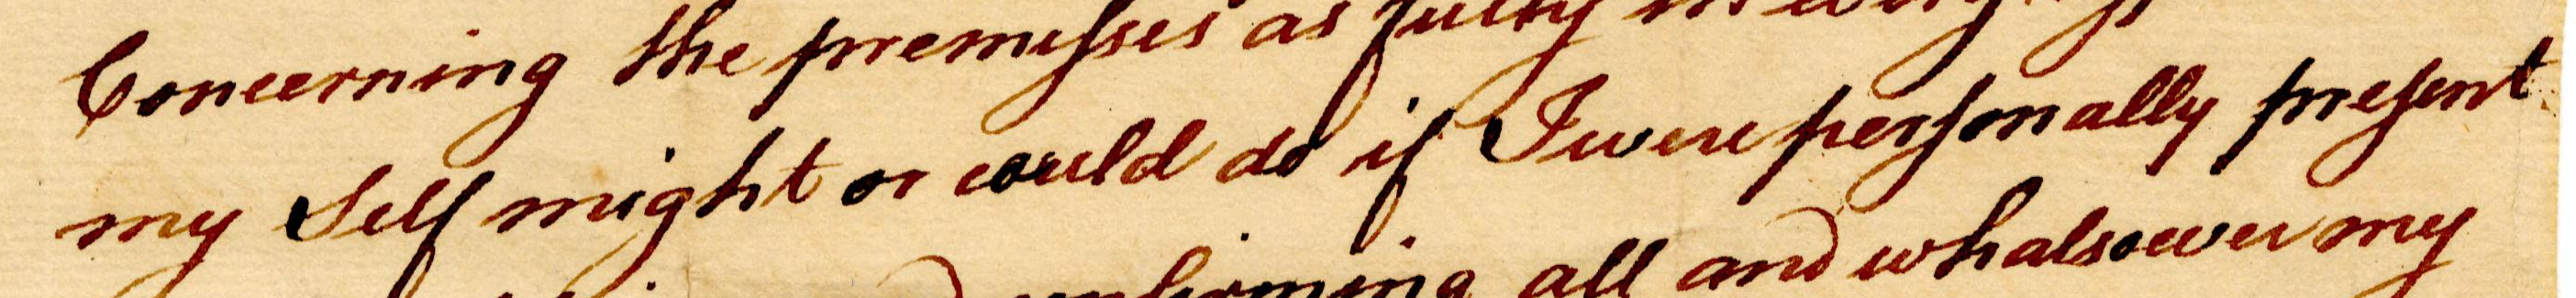my Self might or could do if I were personally present
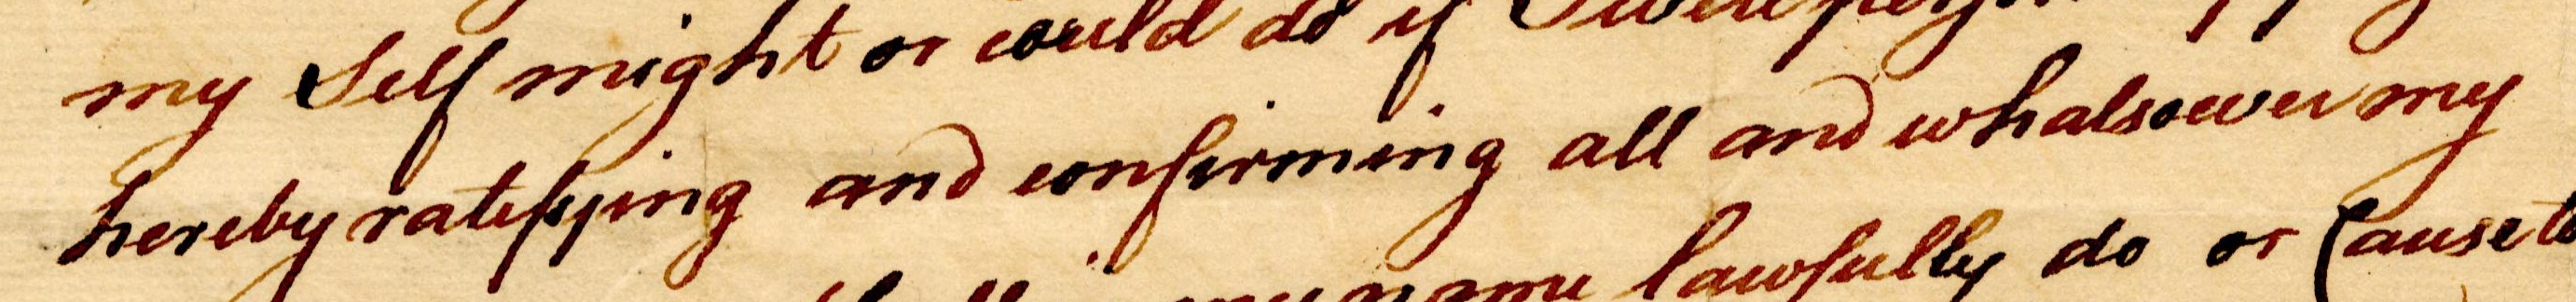hereby ratifying and confirming all and whatsoever my
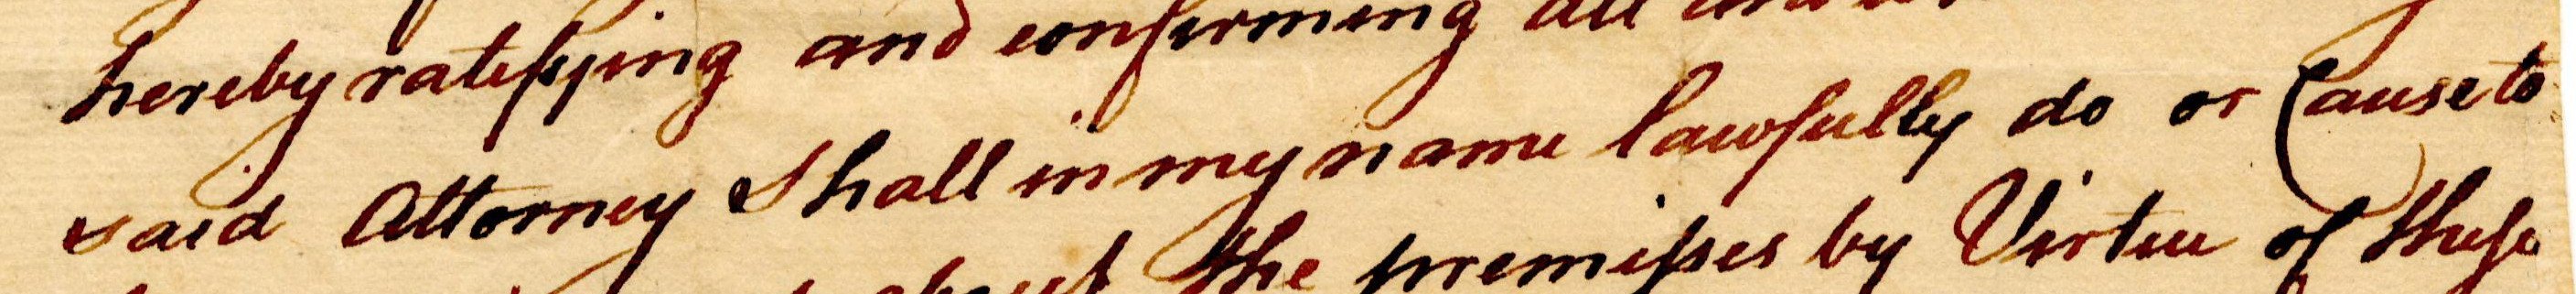said Attorney Shall in my name lawfully do or Cause to
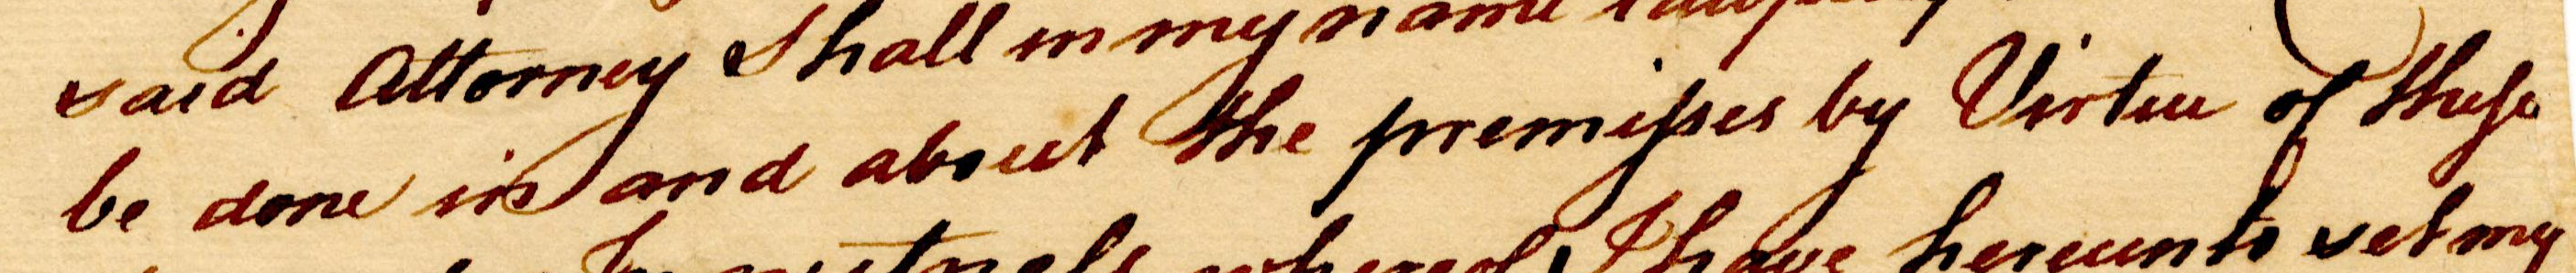be done in and about the premisses by Virtue of these
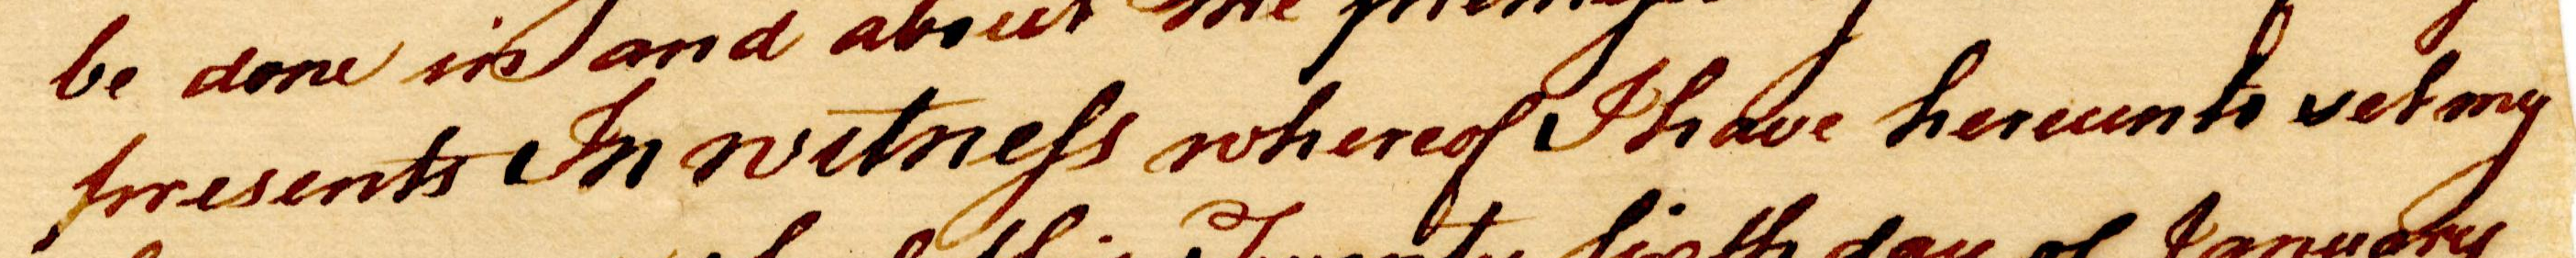presents In witness whereof I have hereunto set my
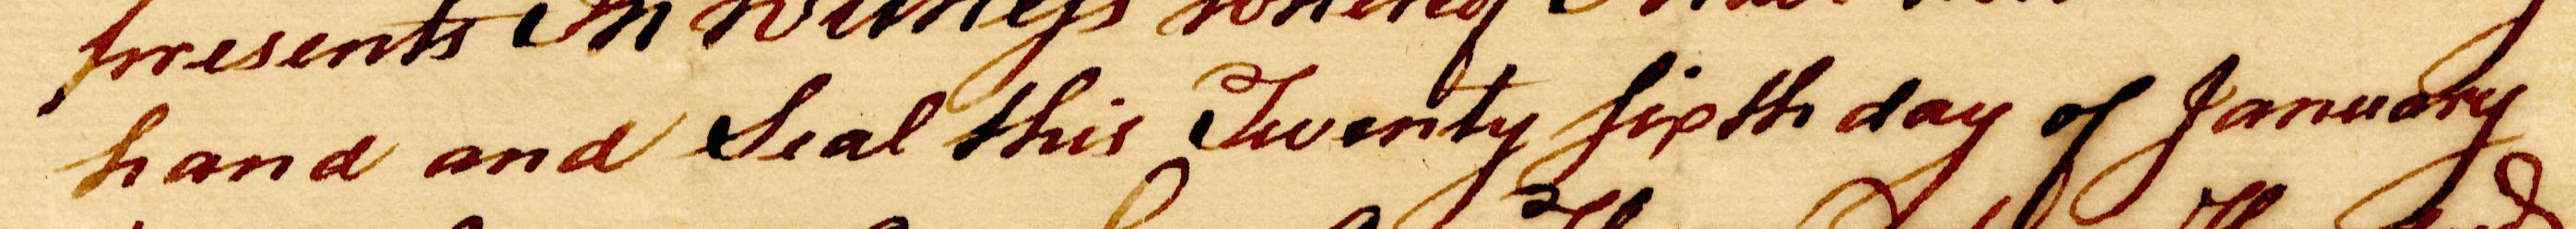hand and Seal this Twenty sixth day of January
